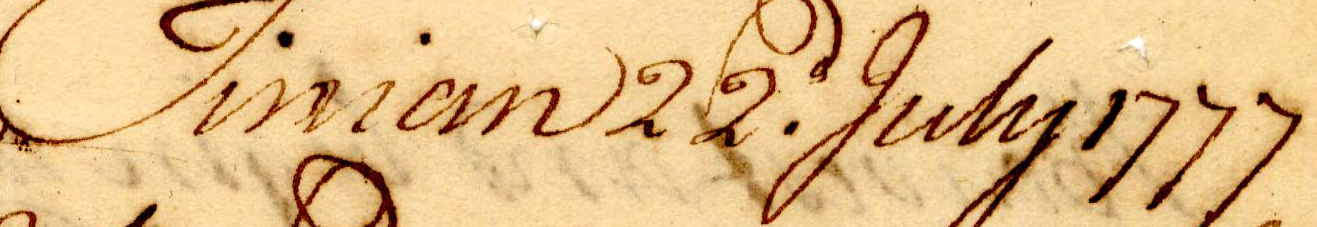Tinian 22^d. July 1777
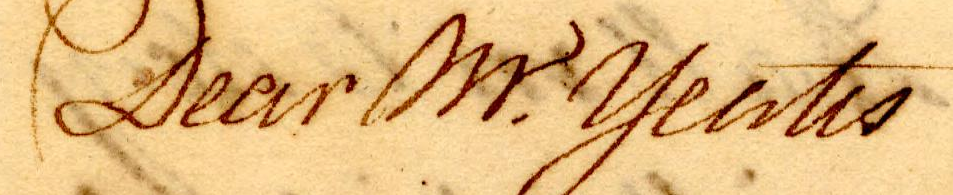Dear M^r. Yeates
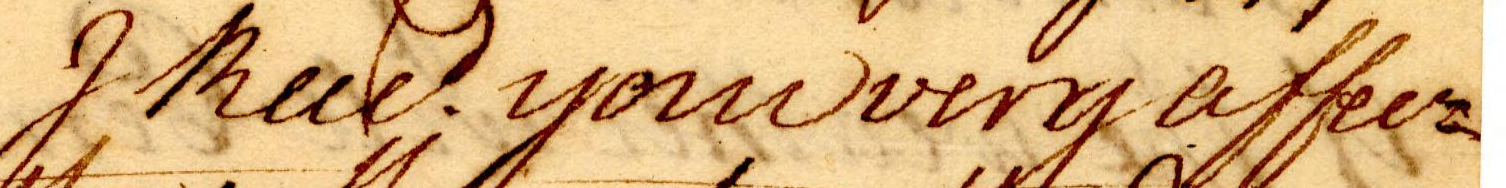I Rec^d your very affec-
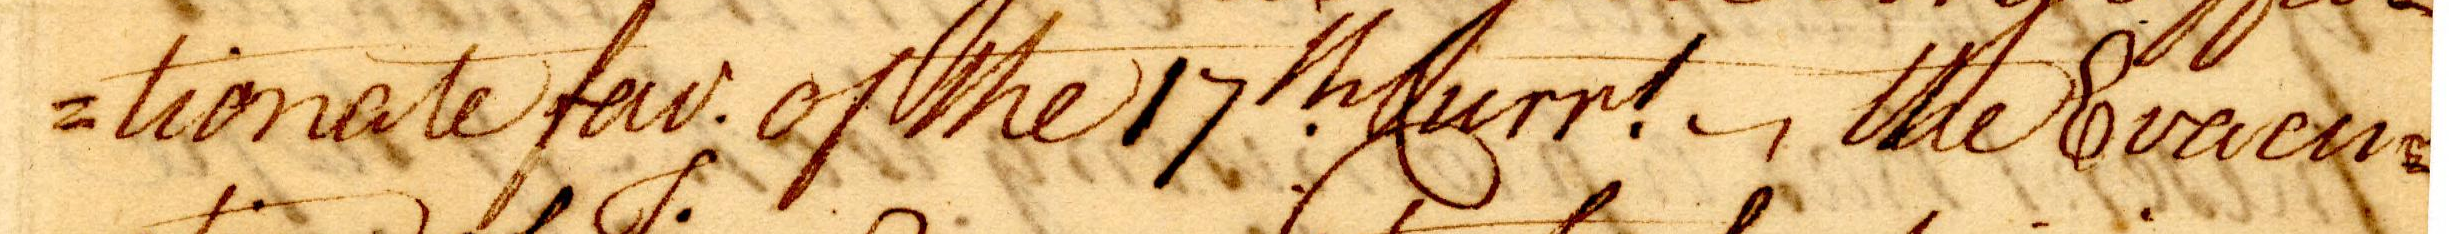-tionate fav. of the 17^th Curr^t. the Evaca-
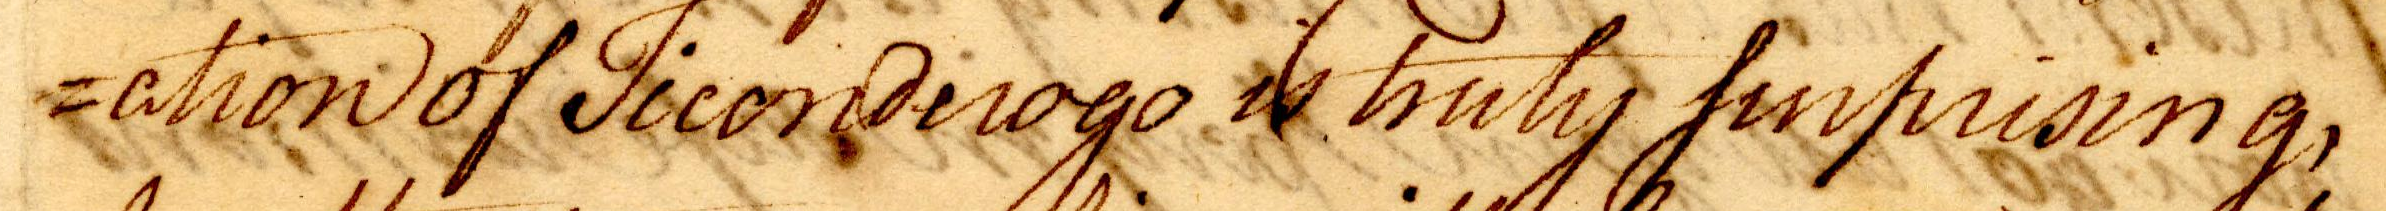-ation of Ticonderogo is truly surprising,
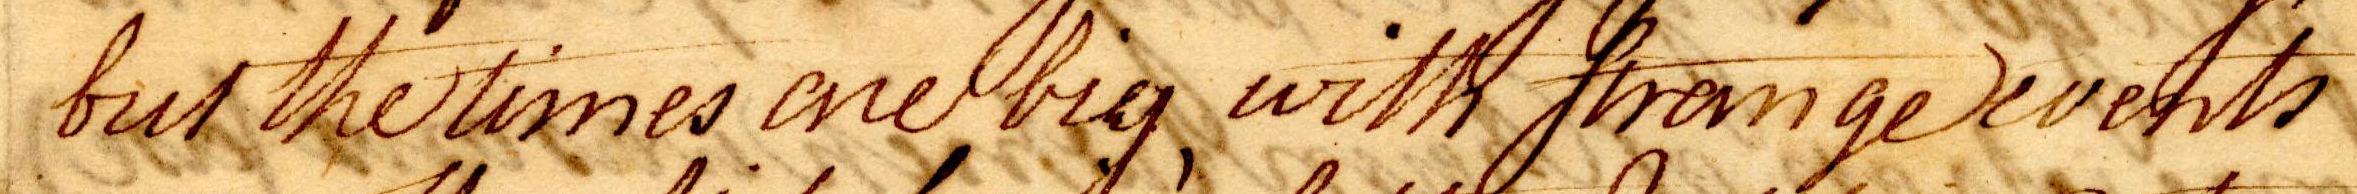but the times are big with strange events
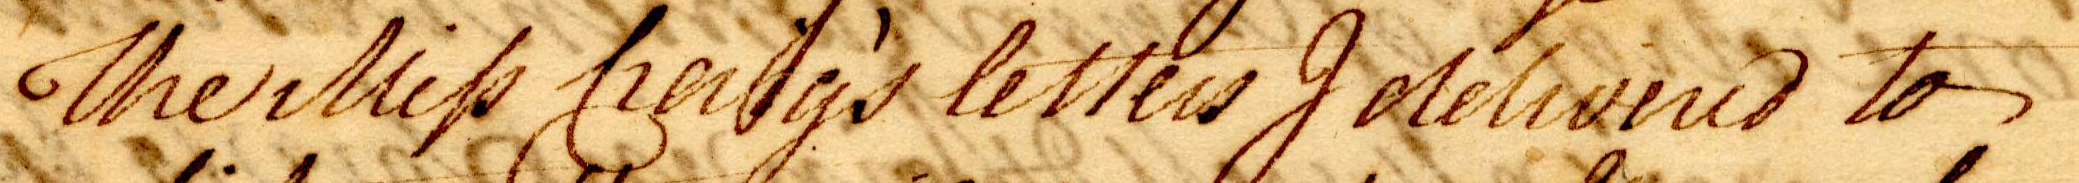The Miss Craig's letters I delivered to
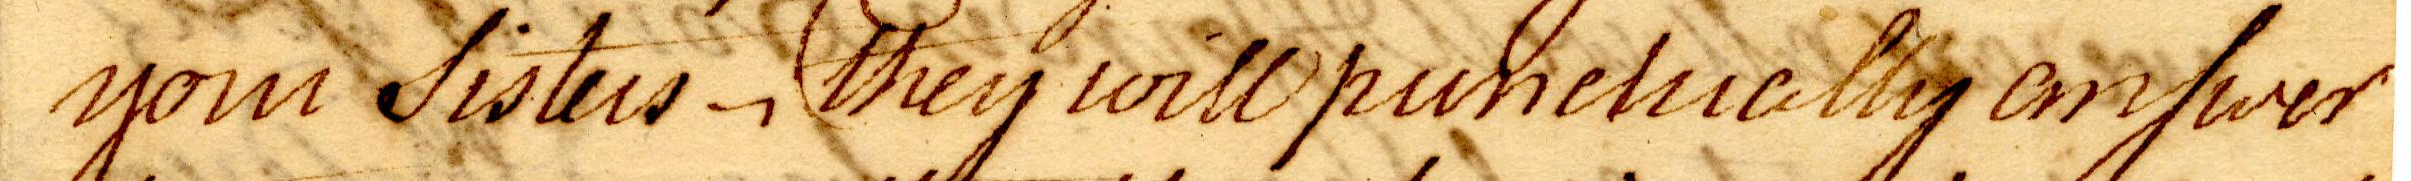your Sisters- (they will punctually answer
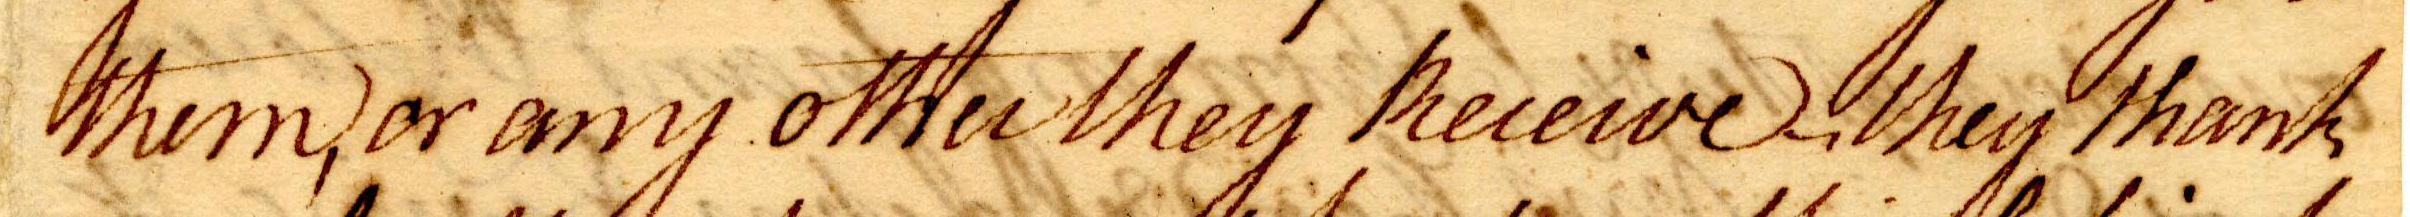them, or any other they Receive), they thank
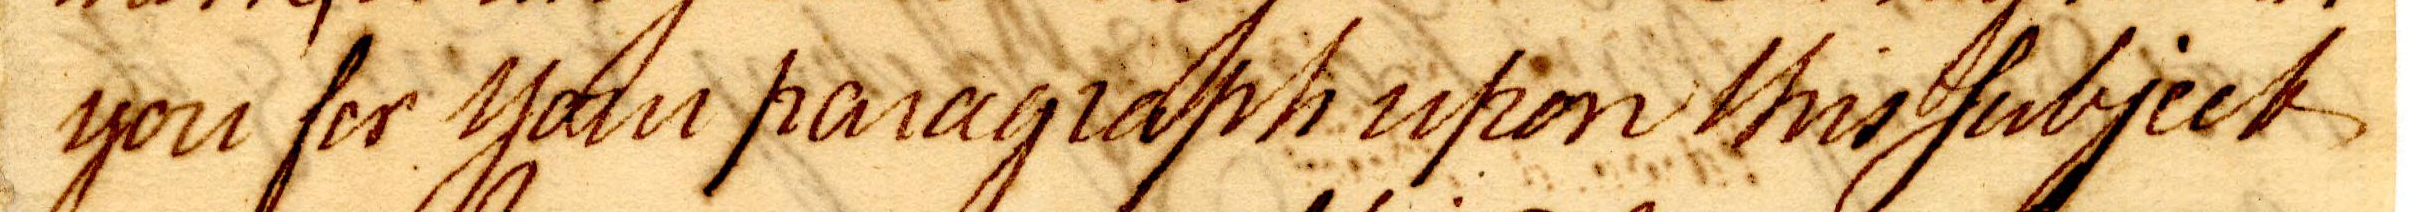you for your paragraph upon this subject
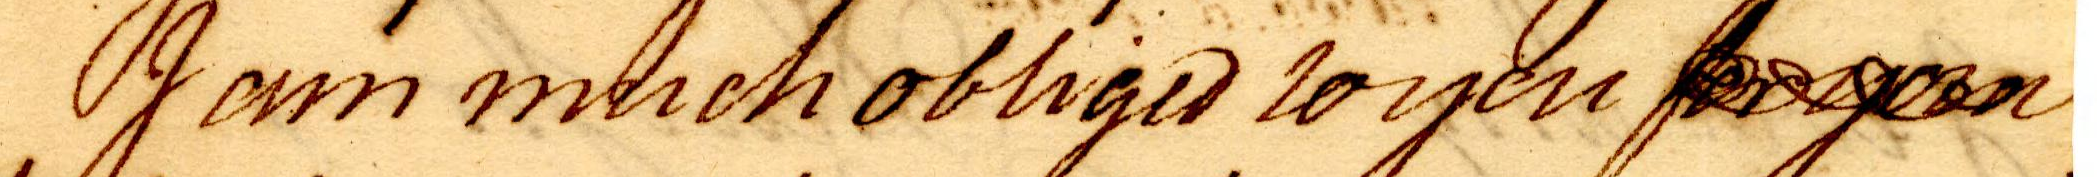I am much obliged to you for your
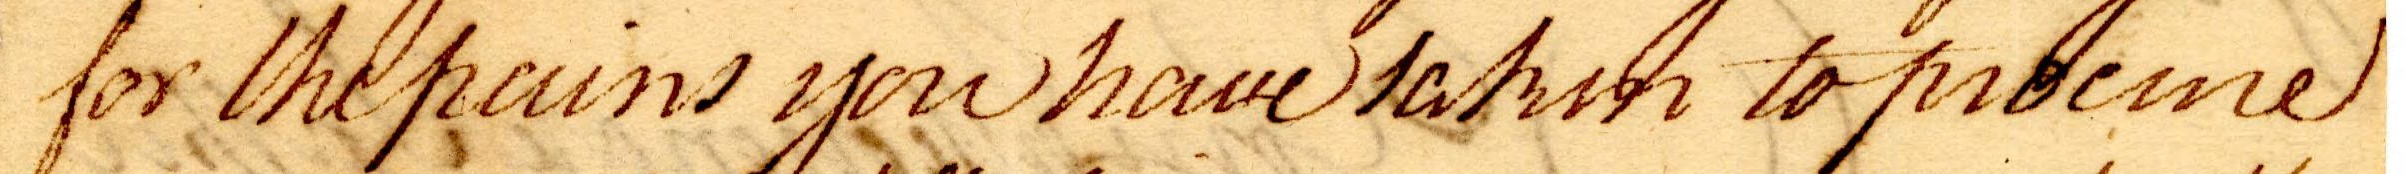for the pains you have taken to procure
